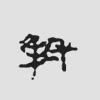{車矢}
